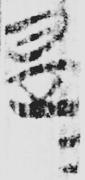是是
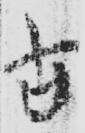古（故）
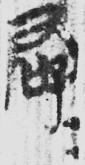君子
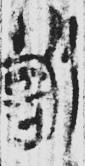○（慎）
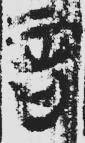言
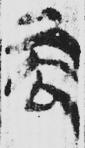而
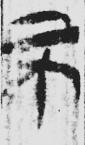不
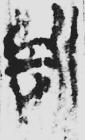○（慎）
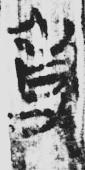事
